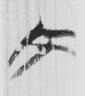文
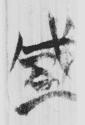城
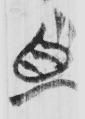且
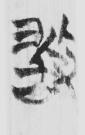敢
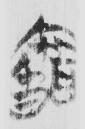{尒䎽}
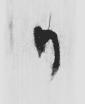人
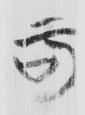可
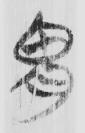胃
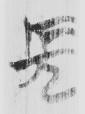長
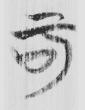可
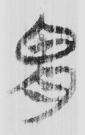胃
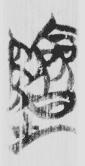險
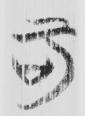可
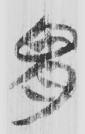胃
